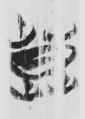莫
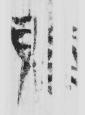責
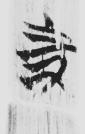寺
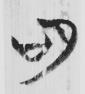名
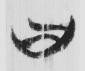曰
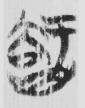智
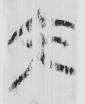內
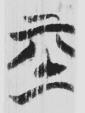{亓土}
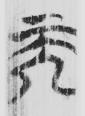而
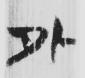外
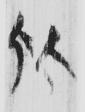比
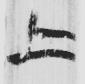上
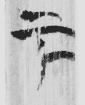下
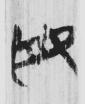母
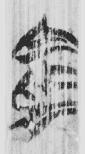倉
